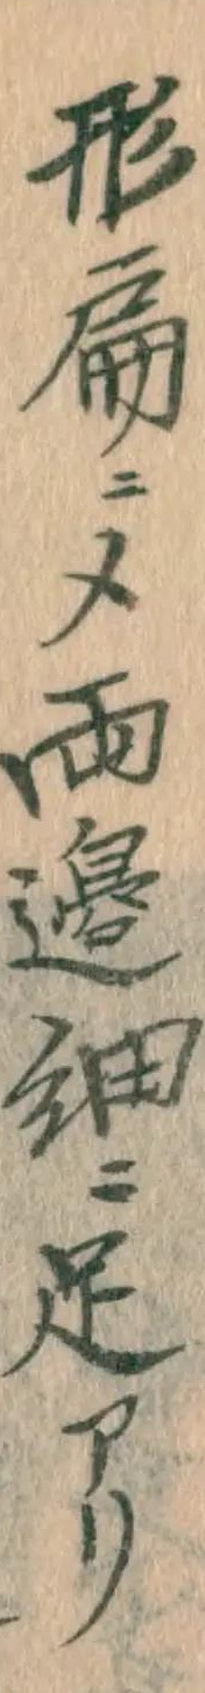形扁ニシテ両邉細ニ足アリ
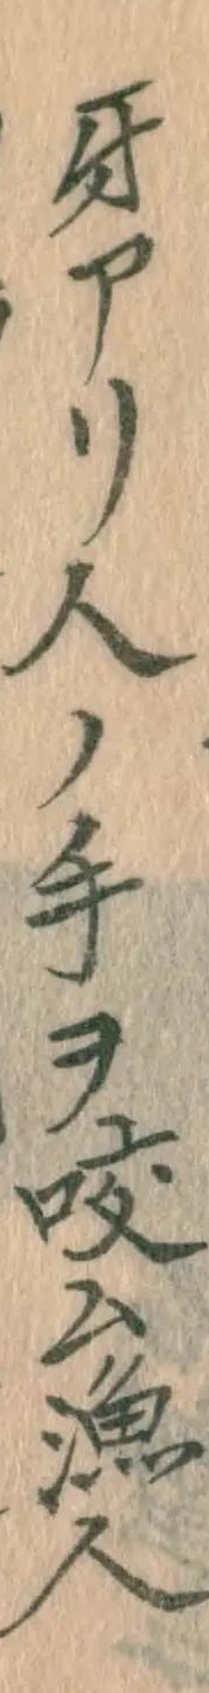牙アリ人ノ手ヲ咬ム漁人
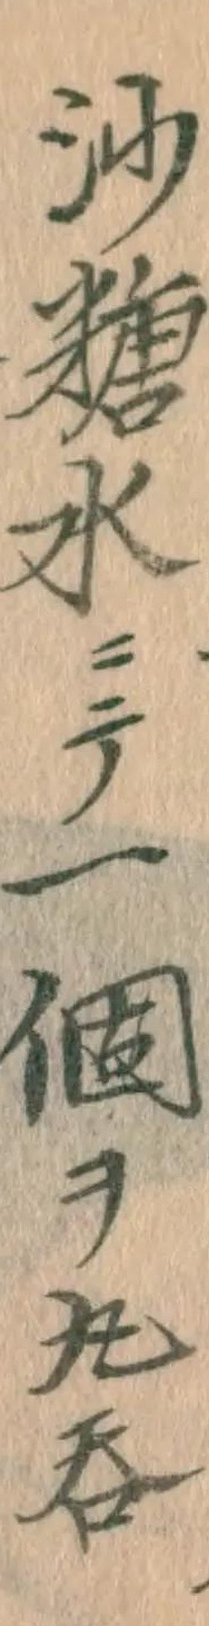沙糖水ニテ一個ヲ丸呑
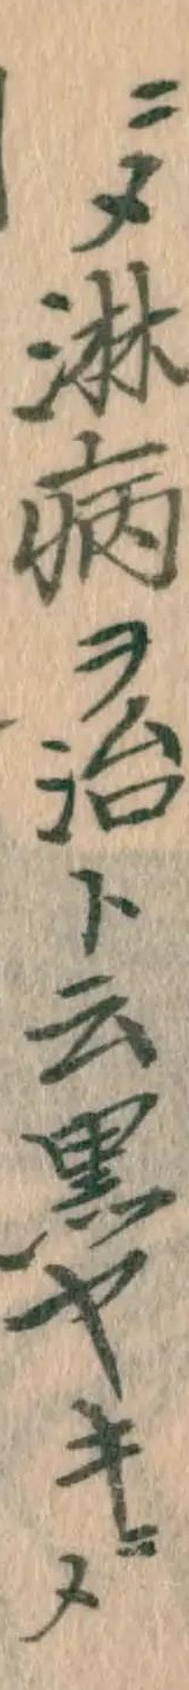ニシテ淋病ヲ治ト云黒ヤキニシテ
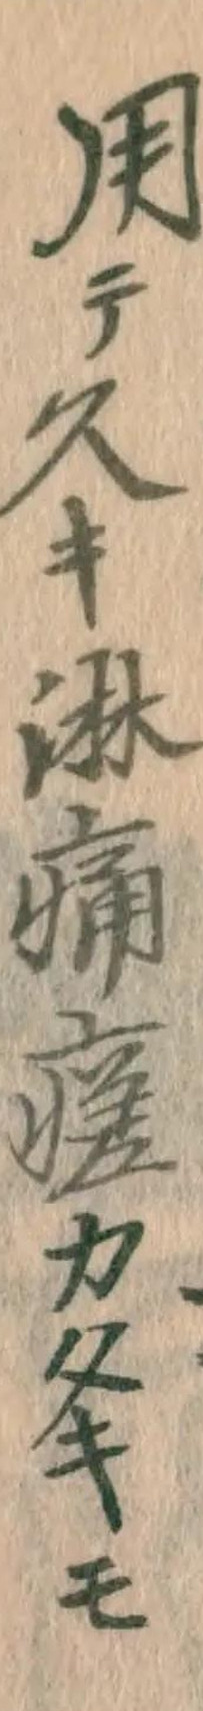用テ久キ淋痛瘥カタキモ
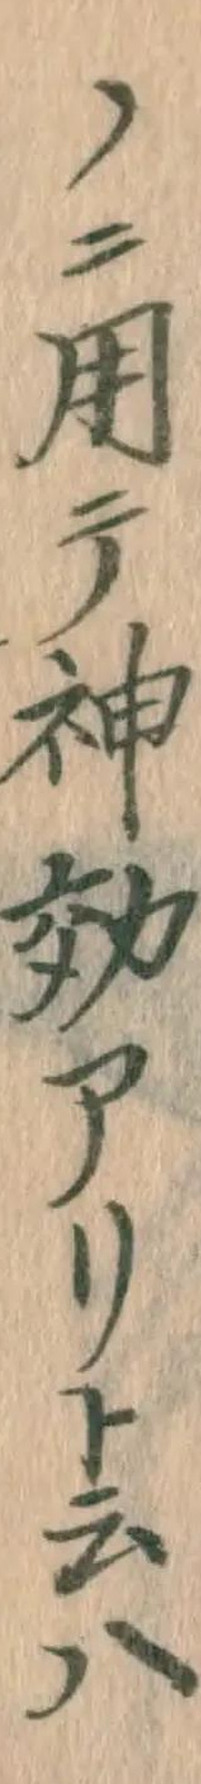ノニ用テ神効アリト云八
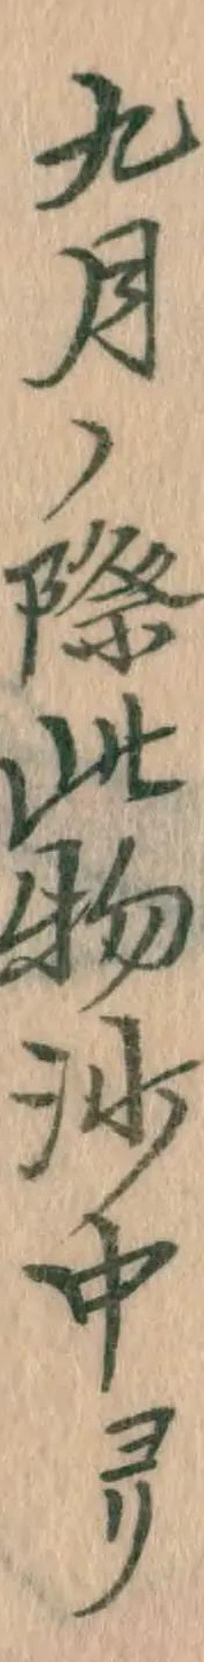九月ノ際此物沙中ヨリ
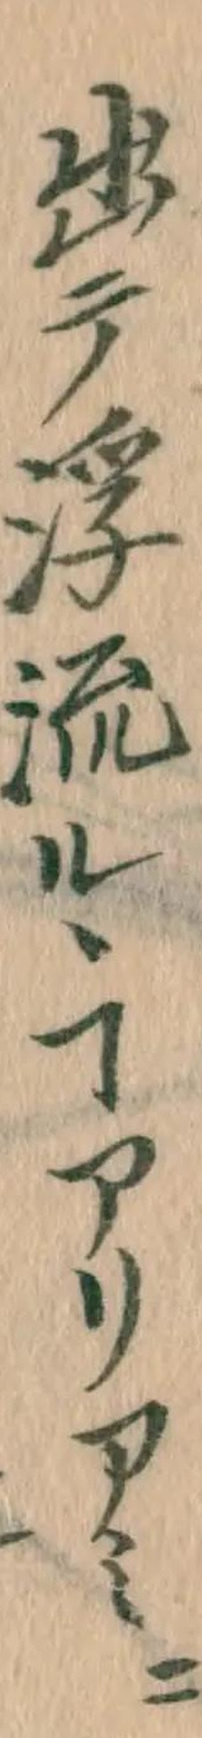出テ浮流ルヽコトアリアミニ
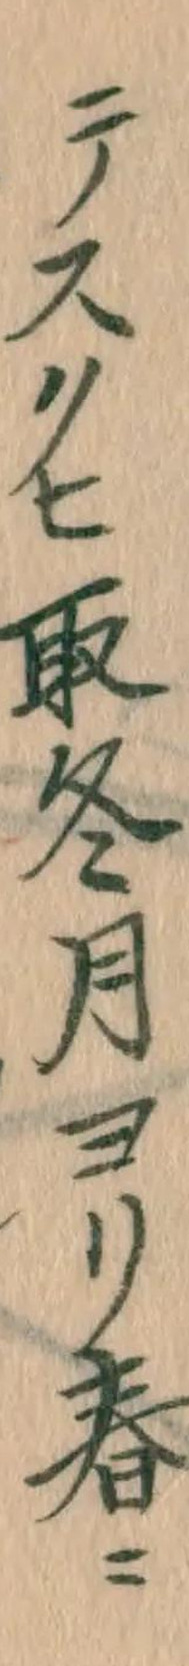テスクヒ取冬月ヨリ春ニ
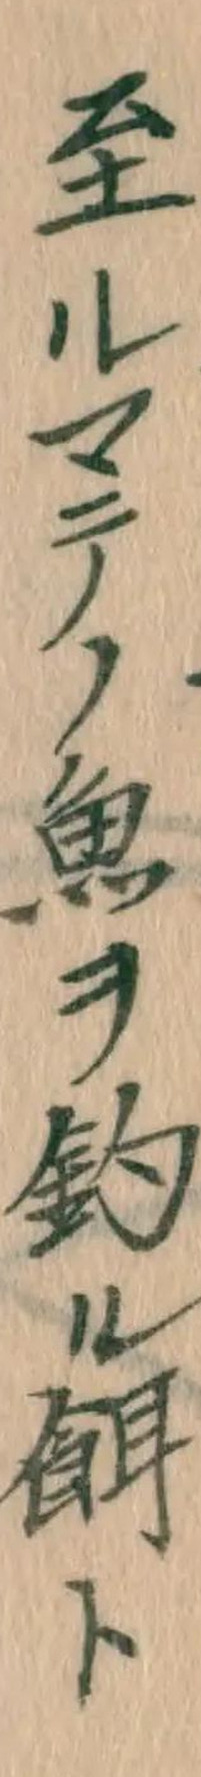至ルマテノ魚ヲ釣ル餌ト
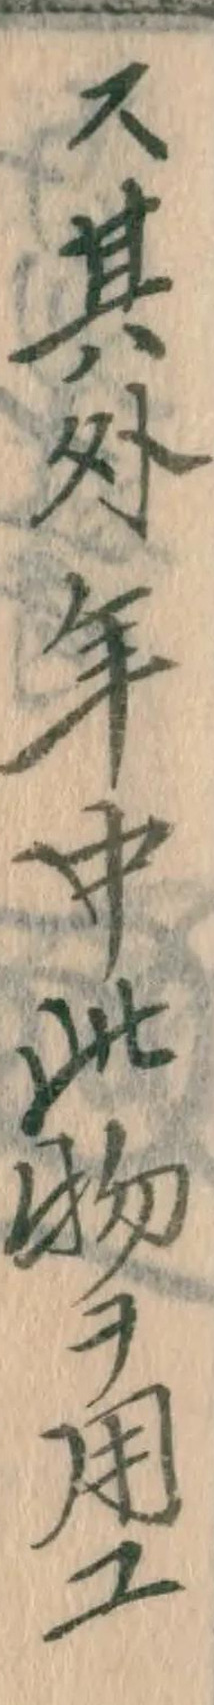ス其外年中此物ヲ用ユ
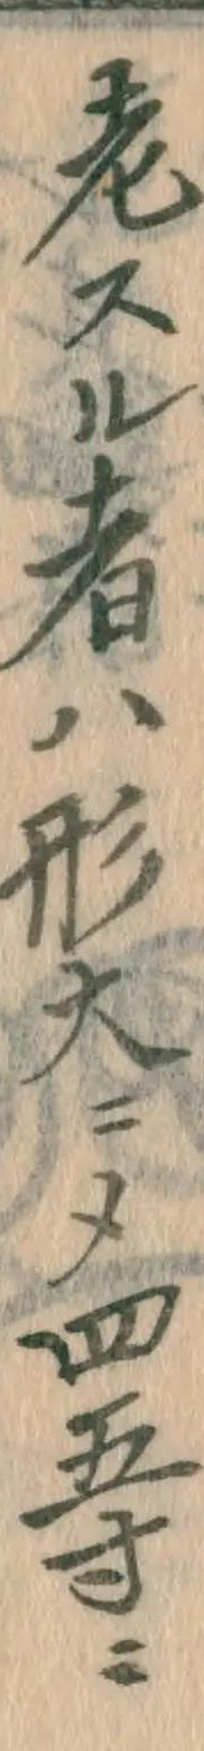老スル者ハ形大ニシテ四五寸ニ
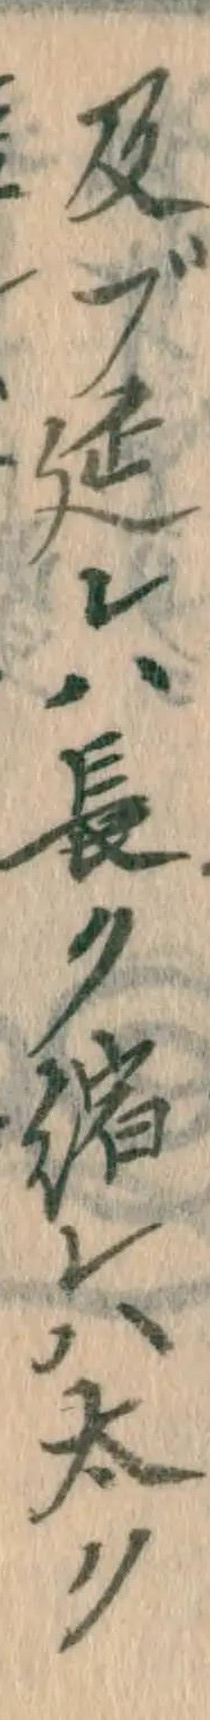及ブ延レハ長ク縮レハ太ク
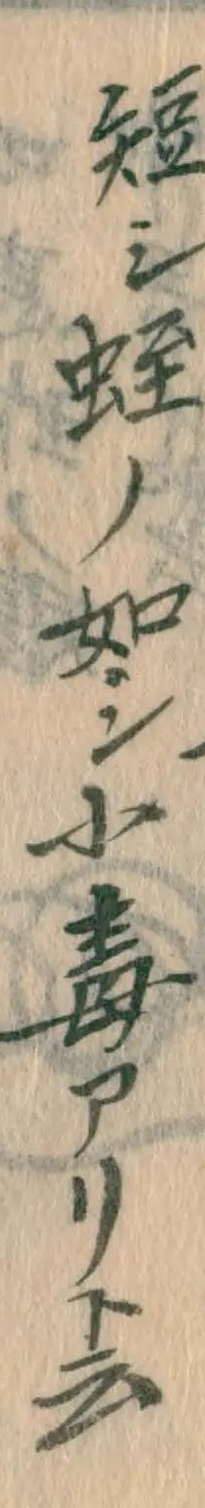短シ蛭ノ如シ小毒アリト云

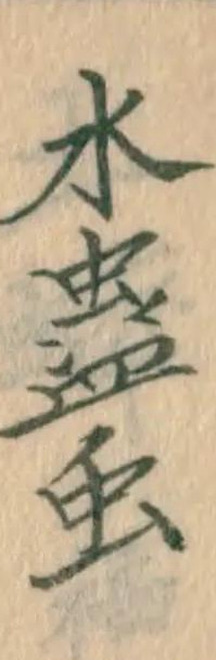水蠱虫
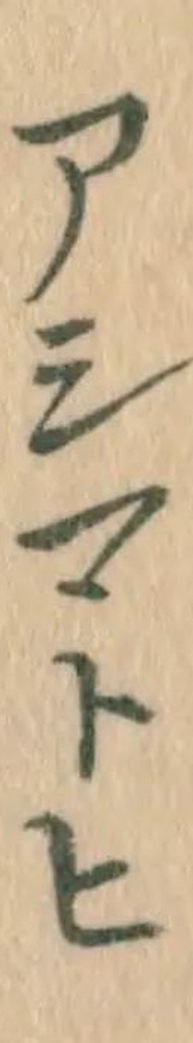アシマトヒ
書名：千蟲譜 3巻. [2]
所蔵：国立国会図書館 National Diet Library, JAPAN
